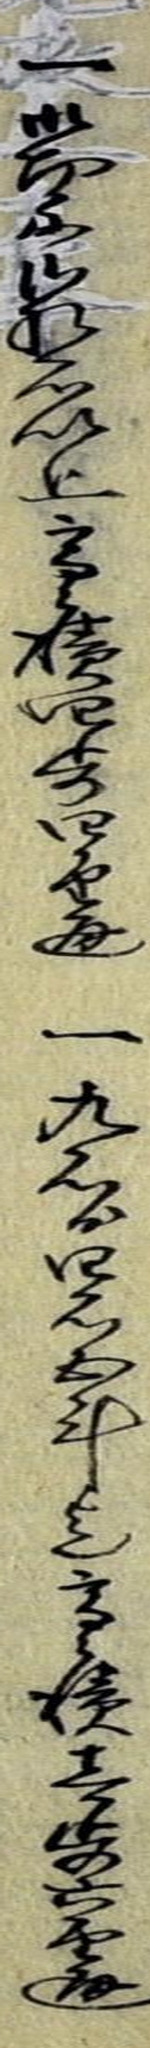一御切米弐拾石以上高ニ積四歩四厘通一九石ゟ四石五斗迄高ニ積壱歩六厘通
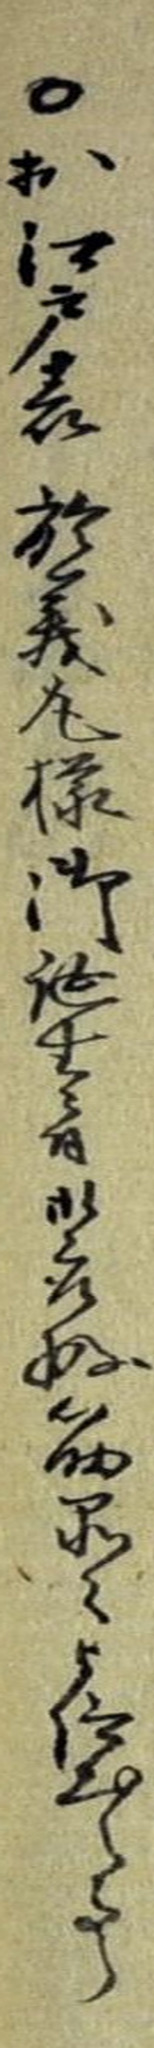〇於江戸表於義丸御誕生ニ付御取扱筋品々被仰出候事
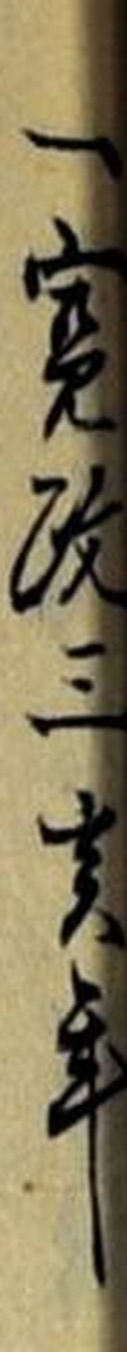一寛政三亥年
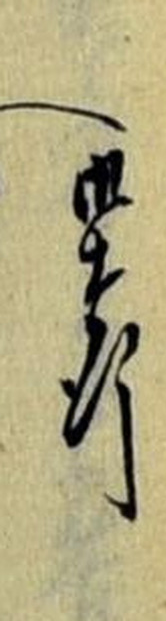御奉行
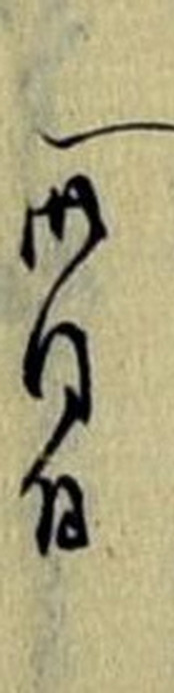御目付
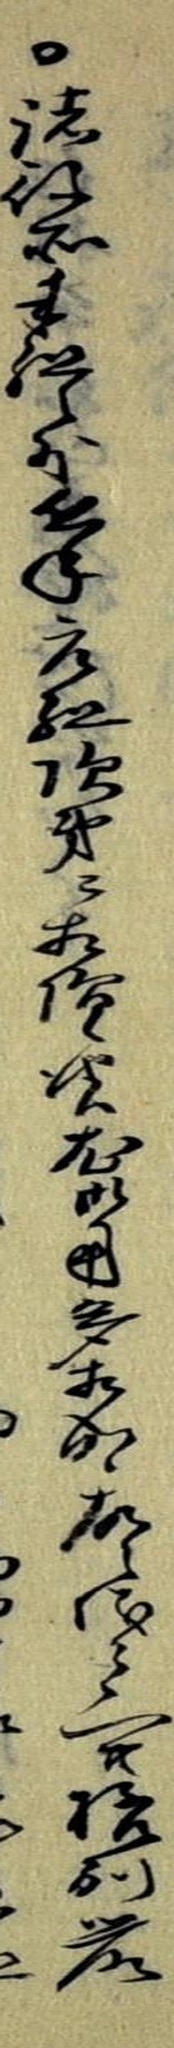〇諸役所手組之外近年取組次第ニ相増候儀ハ尤御用多相成候故之儀ニ候へ共格別厳
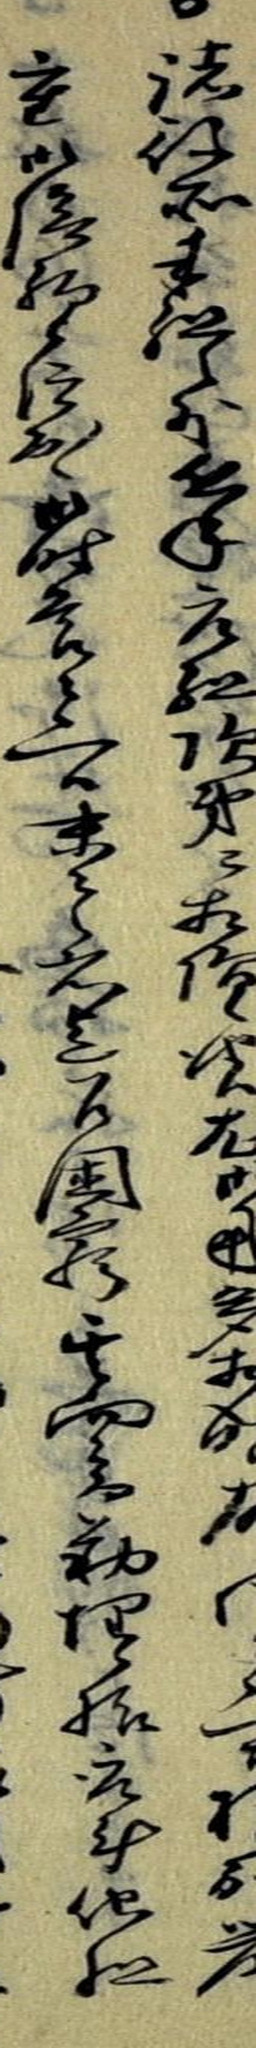重御倹約被仰出候御時節ニ候ヘハ末々之者迄乍困窮其向ニ而勤埋候様取計他組
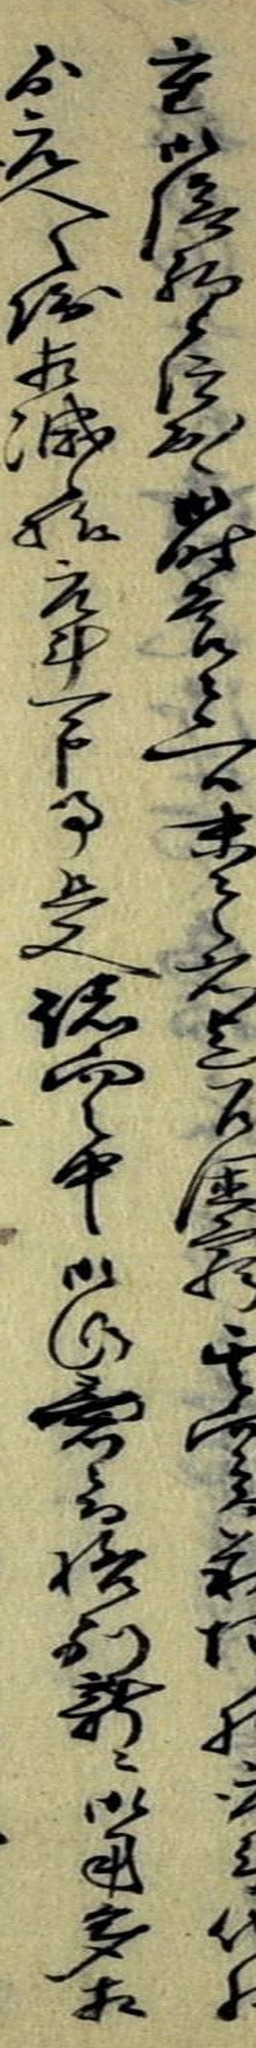ゟ取人之儀相減候様取計可申事且又諸向之中御趣意ニ而格別新ニ御用多相
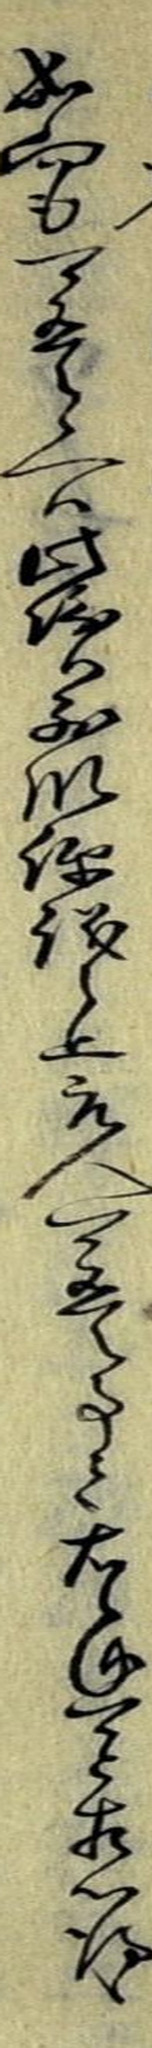成向も可有之候ヘハ此儀ハ別段評議之上取人可有之事ニ候右之趣可被相心得候
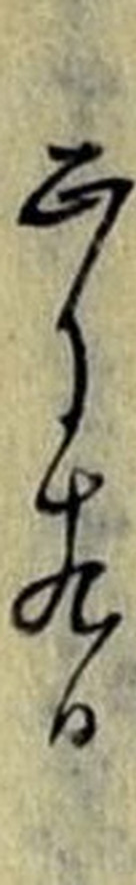正月十九日
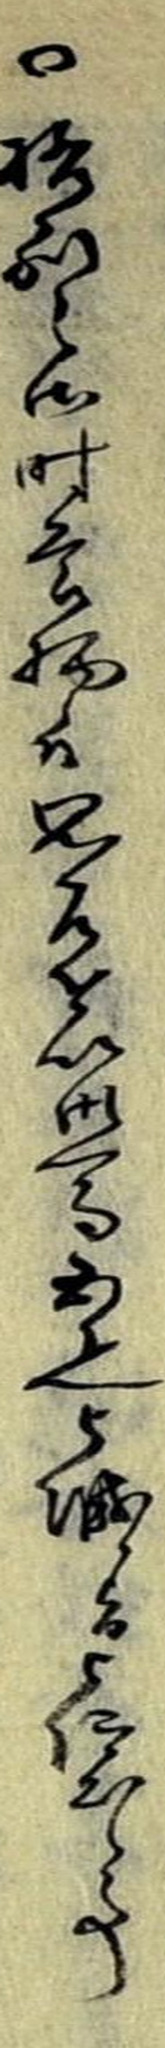〇格別之御時節柄ニ付思召を以御馬五疋被減候旨被仰出候事
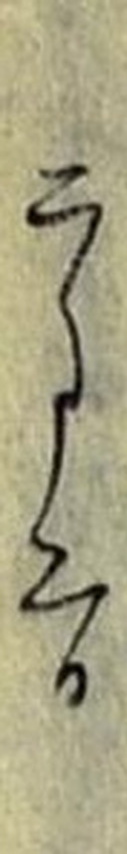二月二日
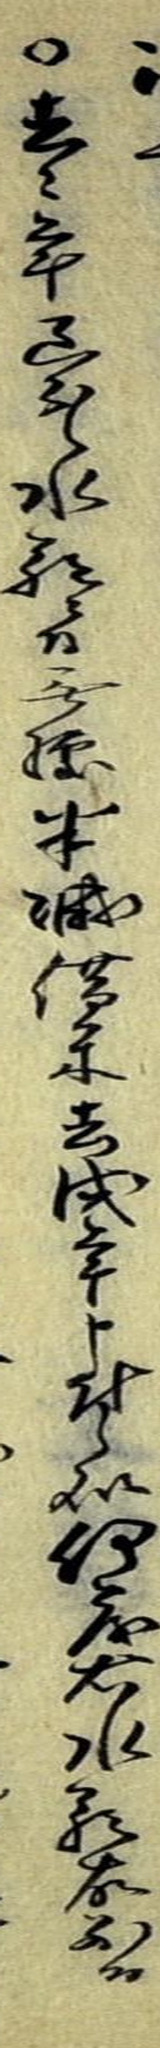〇去々年過分之水難ニ付無拠半減借米去戌年申付候処何茂右水難故別而
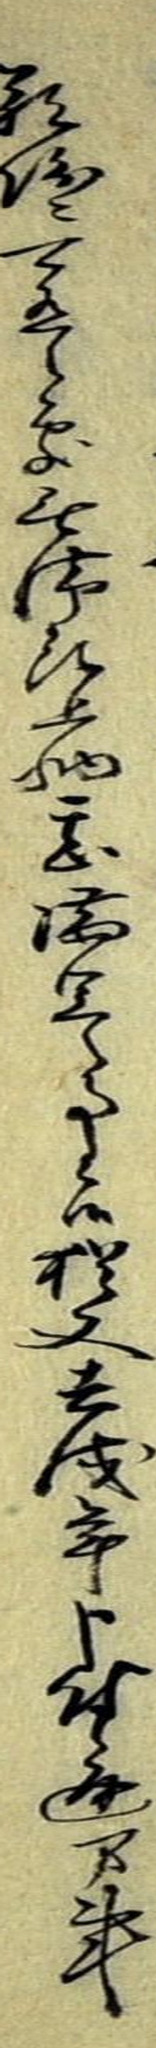難儀ニ可有之候処無滞致上納甚満足之事ニ候猶又去戌年申付候通万事
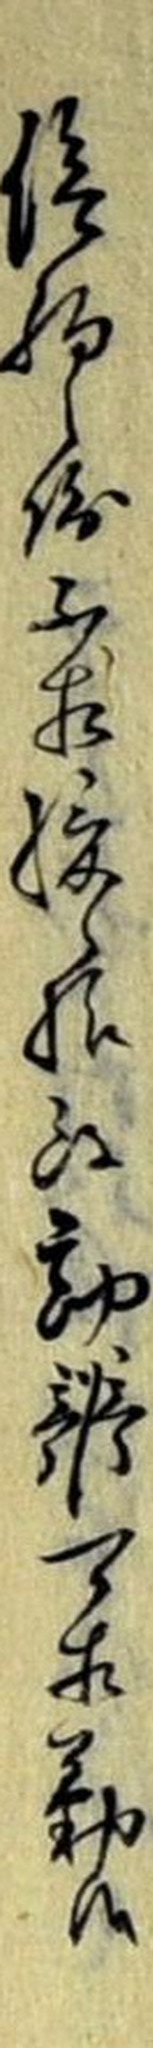倹約之儀不相緩候様致勘弁可相勤候

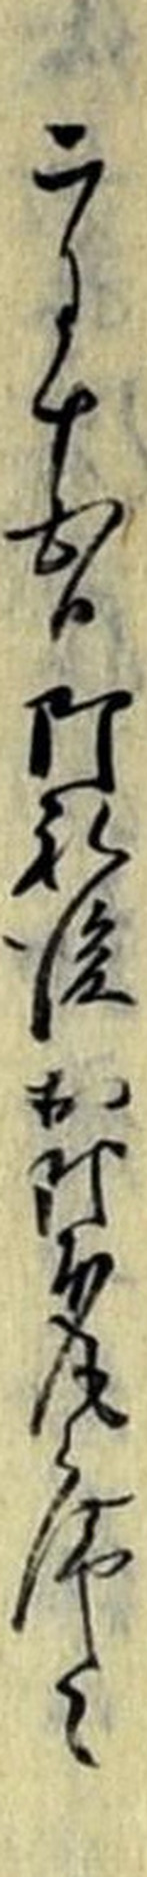二月十五日御礼後於御本丸席々
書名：命令之部 三
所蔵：福井県文書館 Fukui Prefectural Archives
